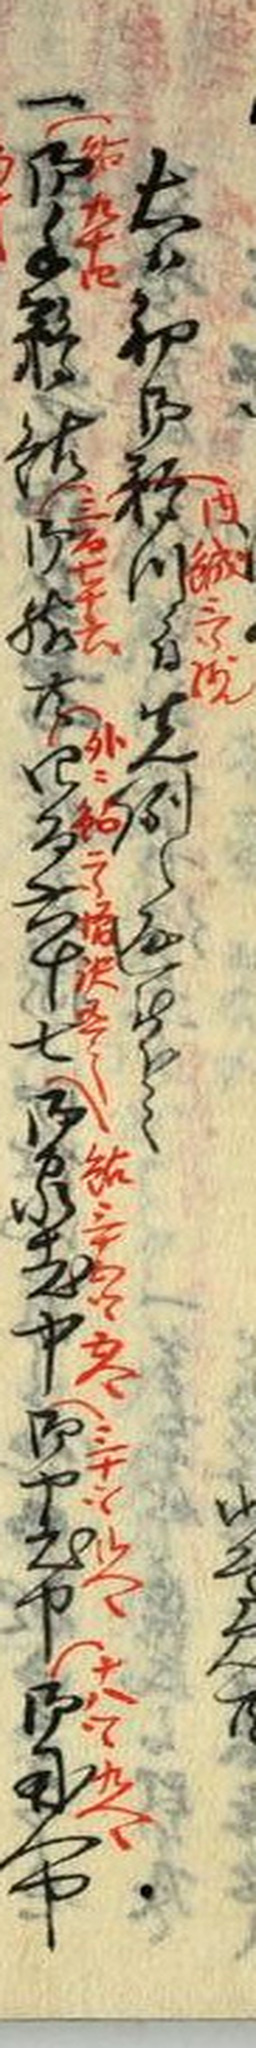一御手鵜鮎御脇共四百六十七御家老中御中老中御用人中
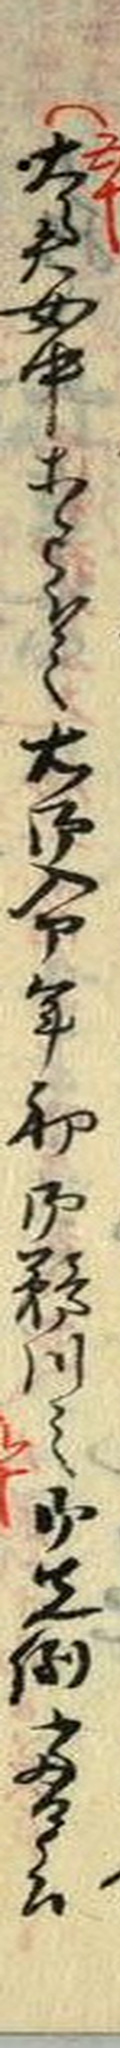大奥女中等被下之右御入部年初御鵜川之御先例当日被召
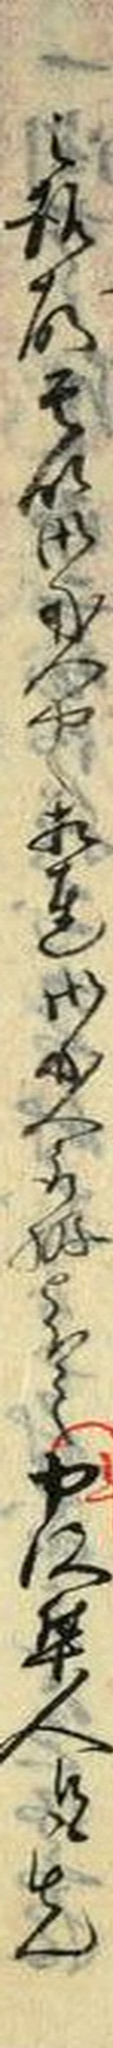之鮎故其以御用人中相達御用人取扱被下之中沢隼人江も先
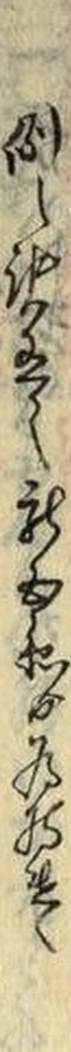例之訳有之新五兵衛ゟ為持遣候
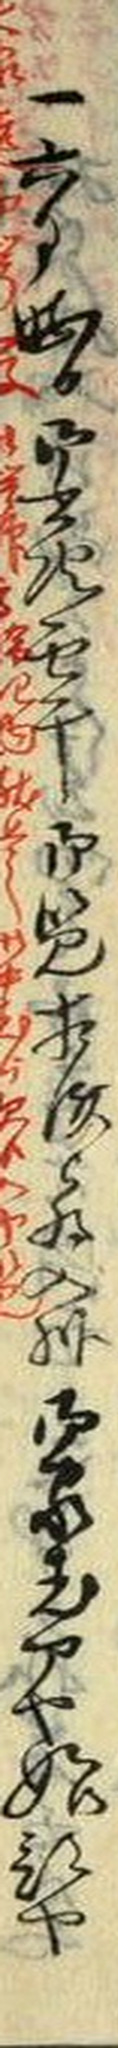一六月晦日御書院虫干御覧相済被為入掛御家老部や始部や
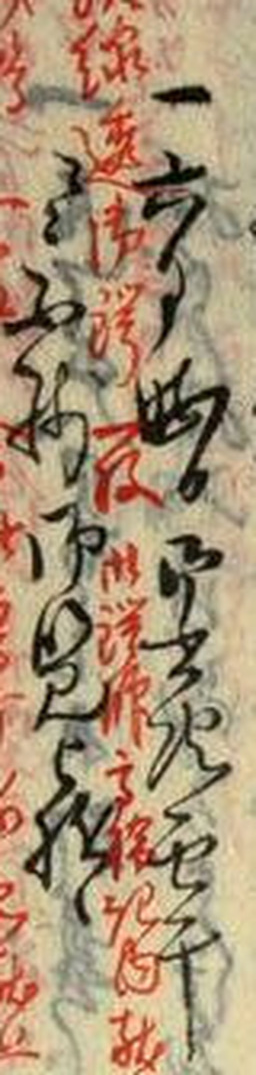〃〃不残御覧被遊候

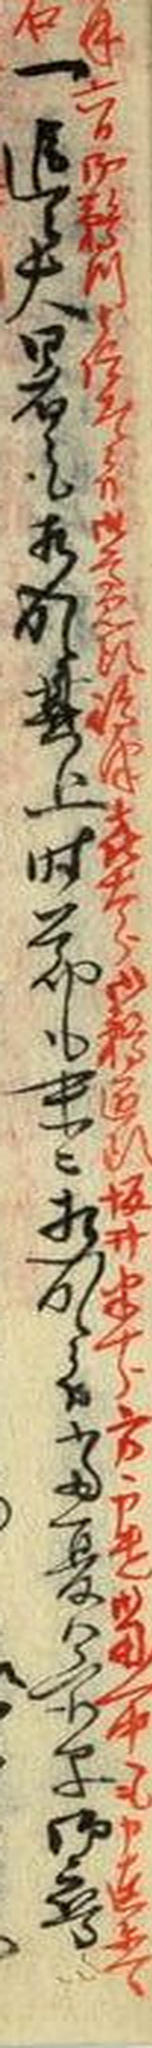一追々大暑ニも相成候其上時節も末ニ相成候ニ付当夏ハ最早御鷹
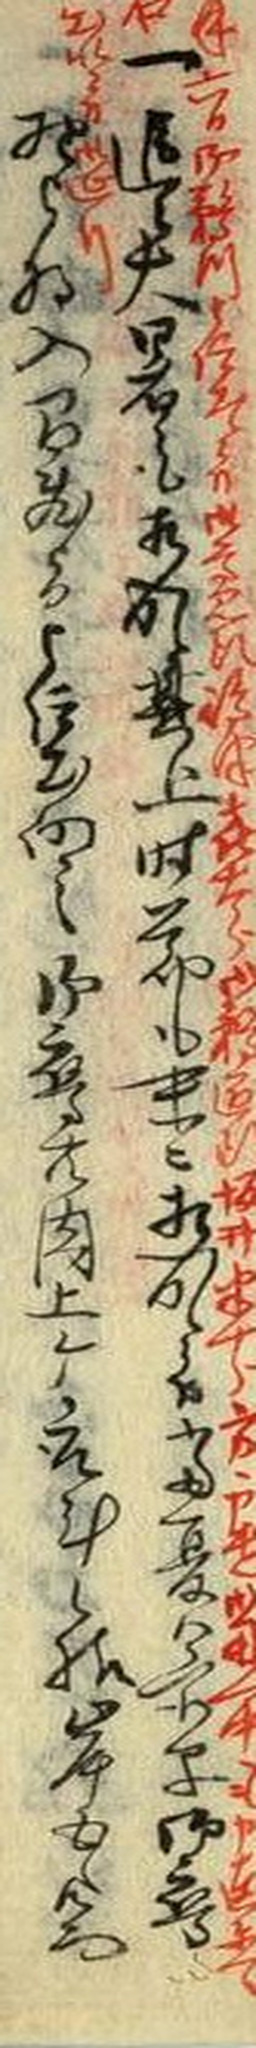野被為入間敷旨被仰出仍之御鷹共へ肉上ケ取斗候様岸五郎左衛門
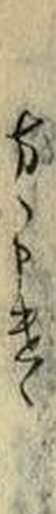方へ申遣候
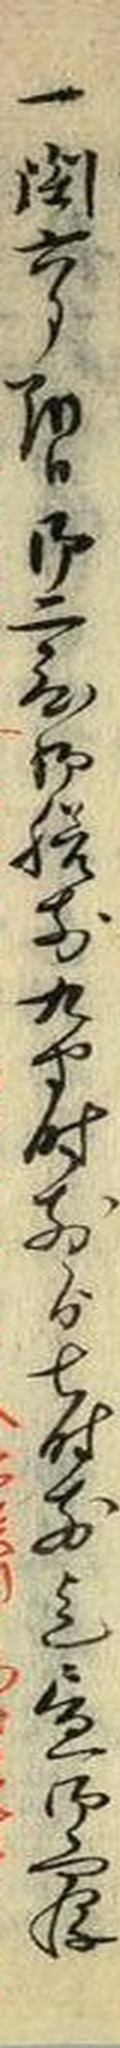一閏六月朔日御二度御膳前九半時前ゟ七時前迄昼御寝
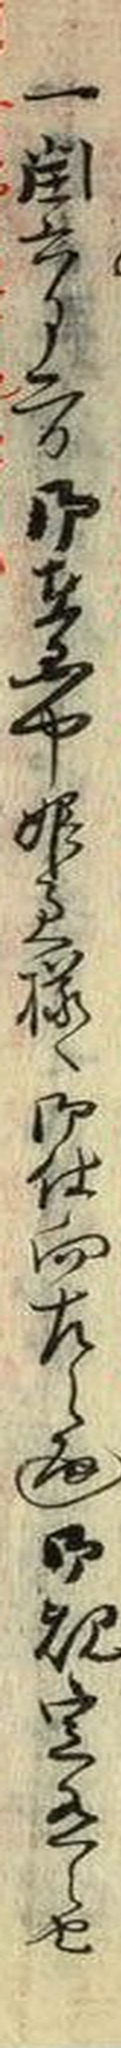一閏六月二日御在国中姫君様へ御仕向左之通御規定有之由
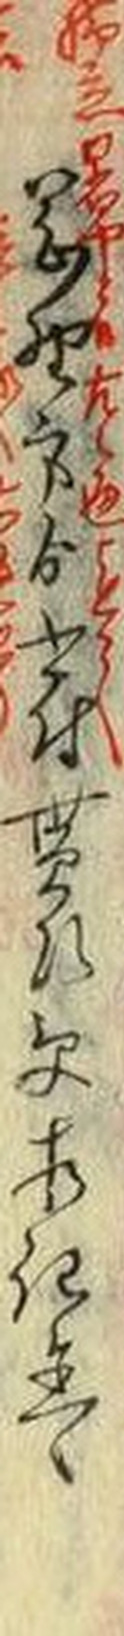岡野方ゟ書付貰ひ受相記置候
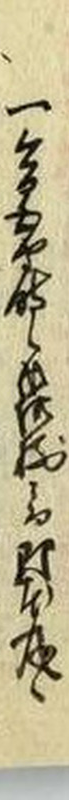一今日五半時御供揃ニ而御本丸へ
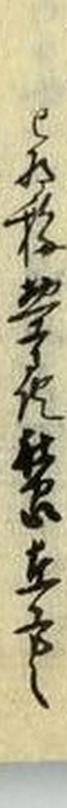被為移惣寺院社家在方之
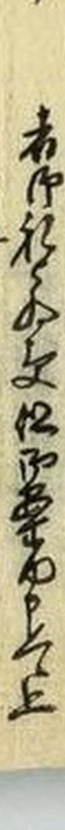者御礼被為受但御案内申上候上
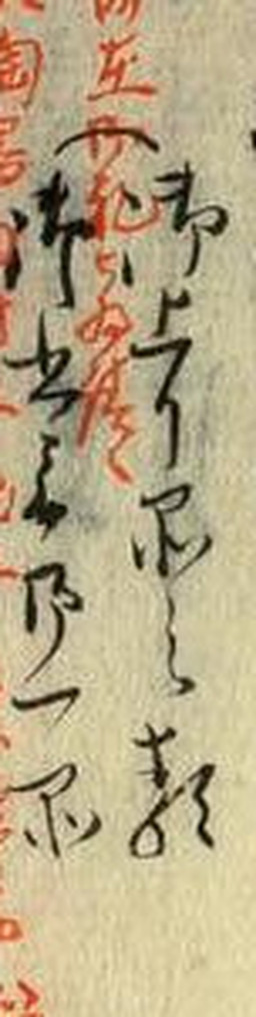御書ニ而御一品
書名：少傅日録抄（斉承付側向頭取日記、在国）
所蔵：福井県文書館 Fukui Prefectural Archives
